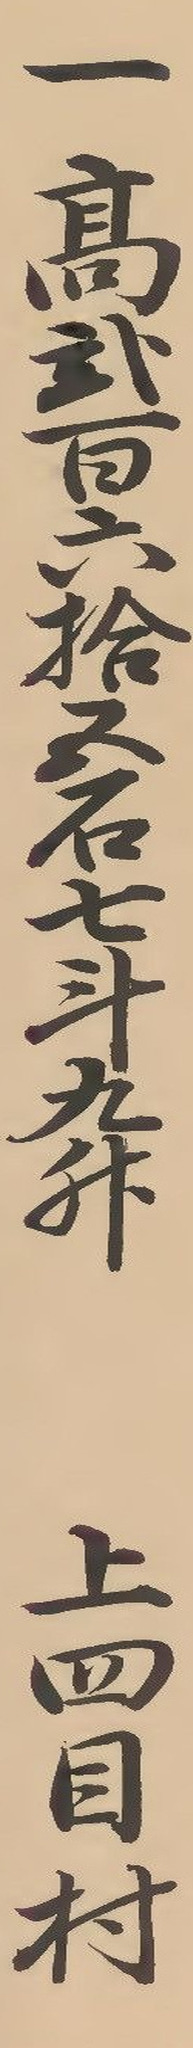一高弐百六拾五石七斗九升上四目村
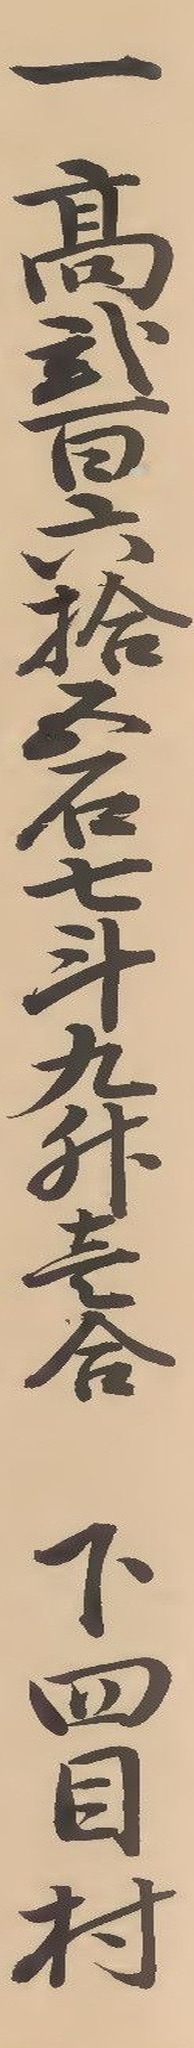一高弐百六拾五石七斗九升壱合下四目村
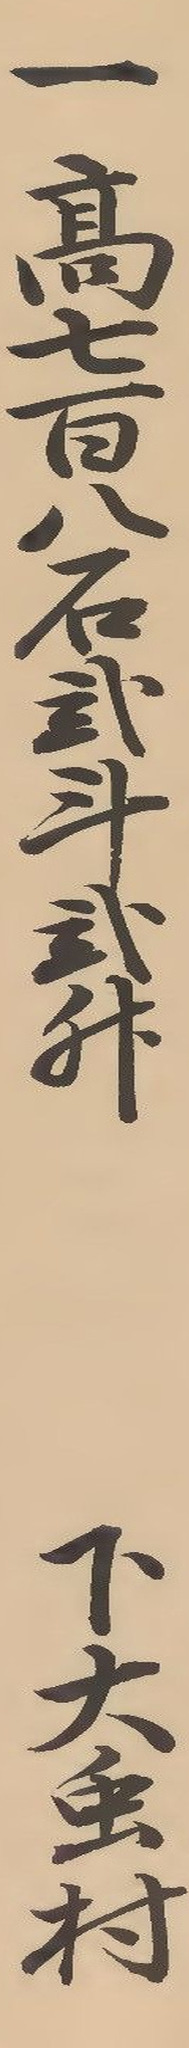一高七百八石弐斗弐升下大虫村
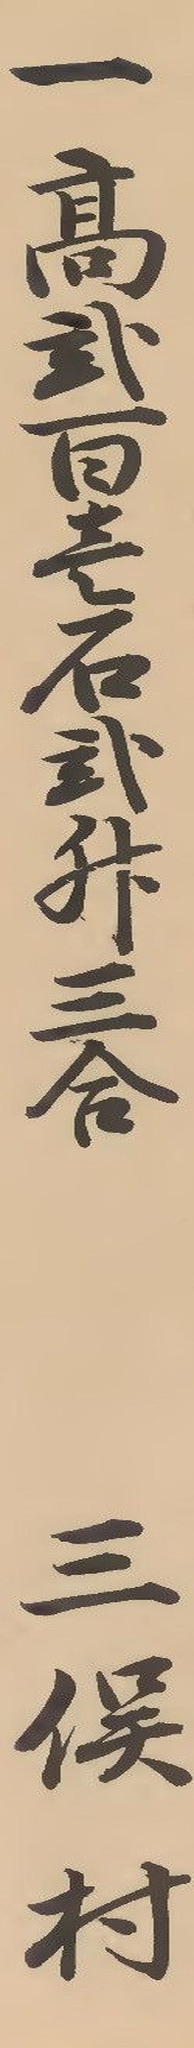一高弐百壱石弐升三合三俣村
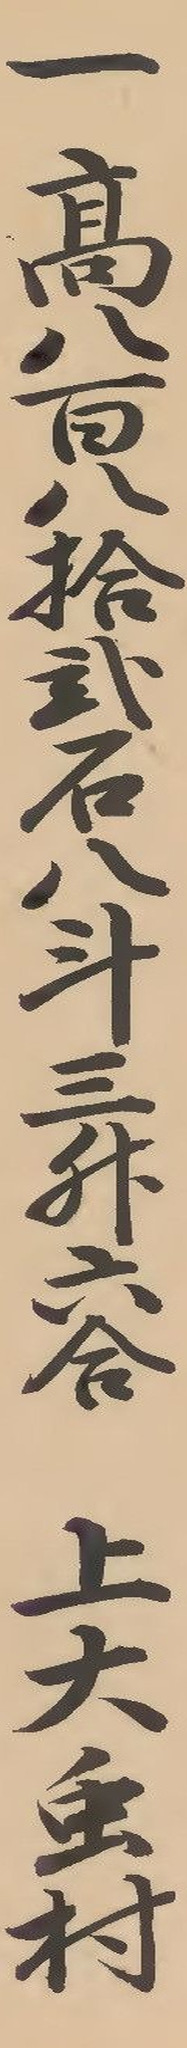一高八百八拾弐石八斗三升六合上大虫村

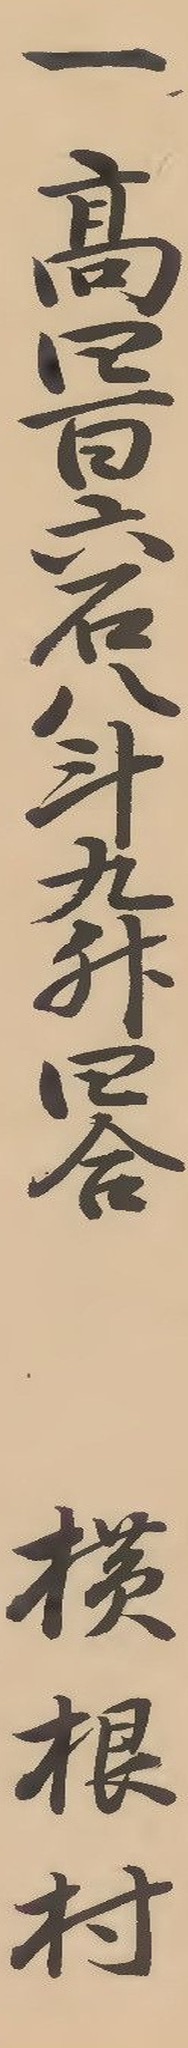一高四百六石八斗九升四合横根村
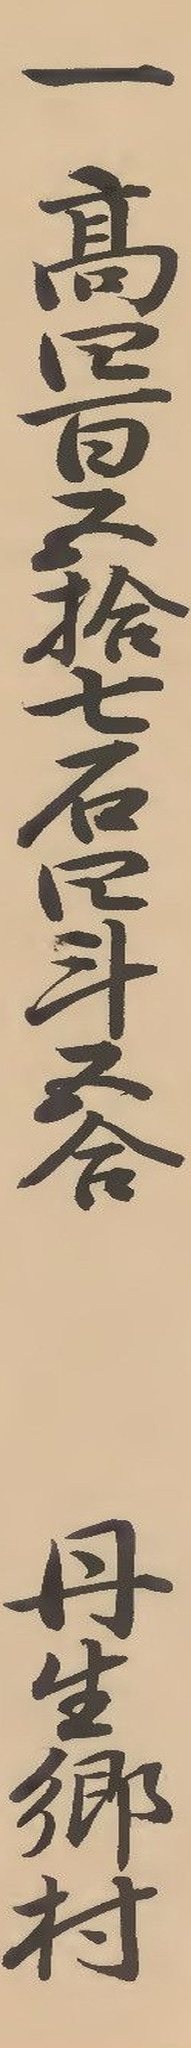一高四百五拾七石四斗五合丹生郷村
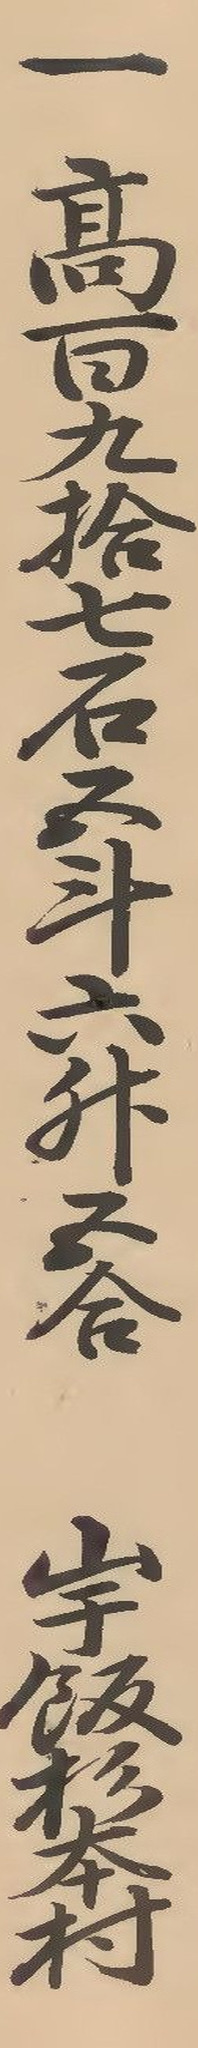一高百九拾七石五斗六升五合山干飯杉本村
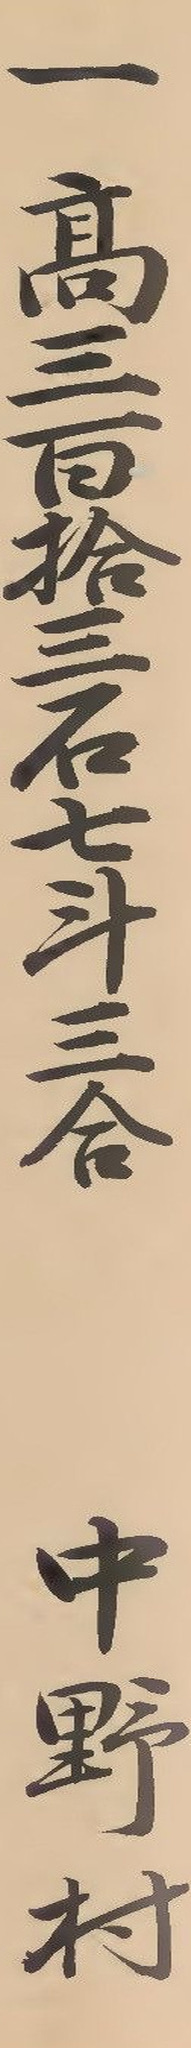一高三百拾三石七斗三合中野村
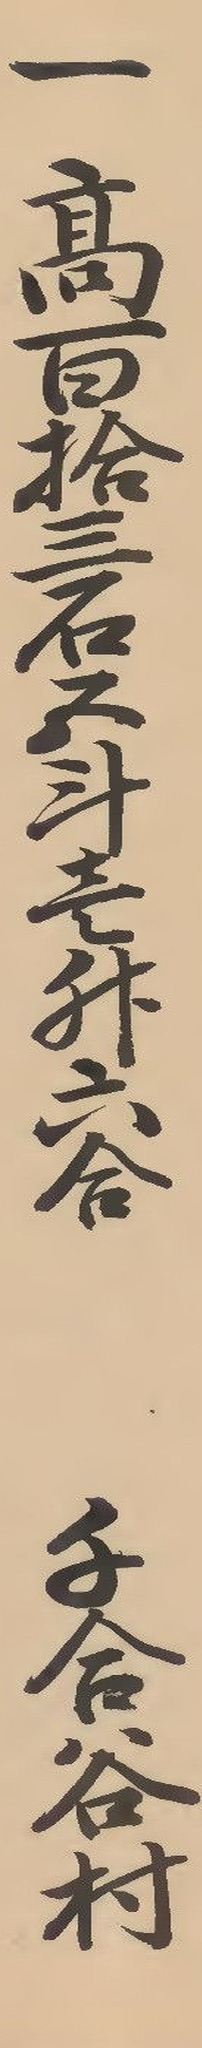一高百拾三石五斗壱升六合千合谷村
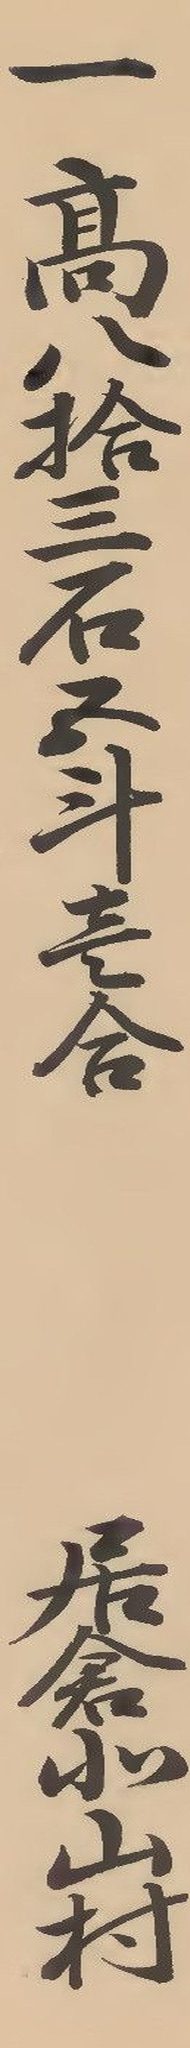一高八拾三石五斗壱合居倉北山村
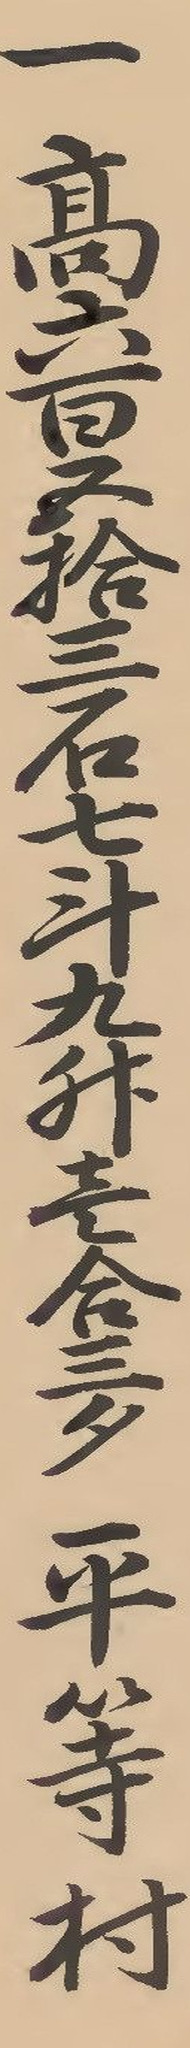一高六百五拾三石七斗九升壱合三勺平等村

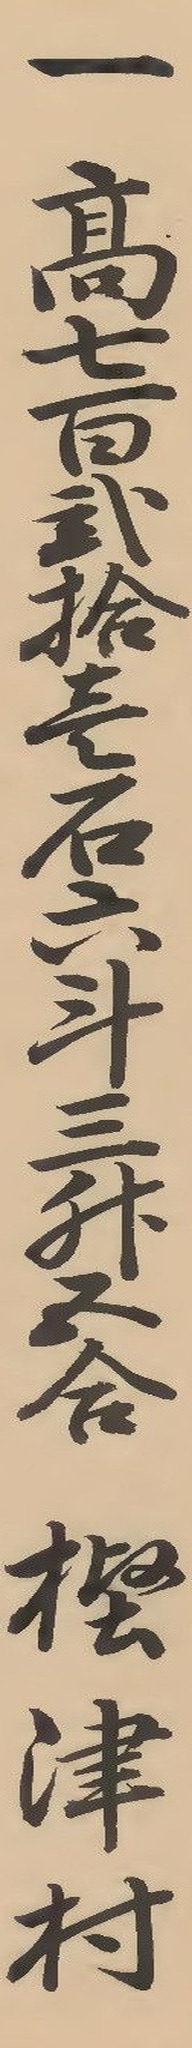一高七百弐拾壱石六斗三升五合樫津村
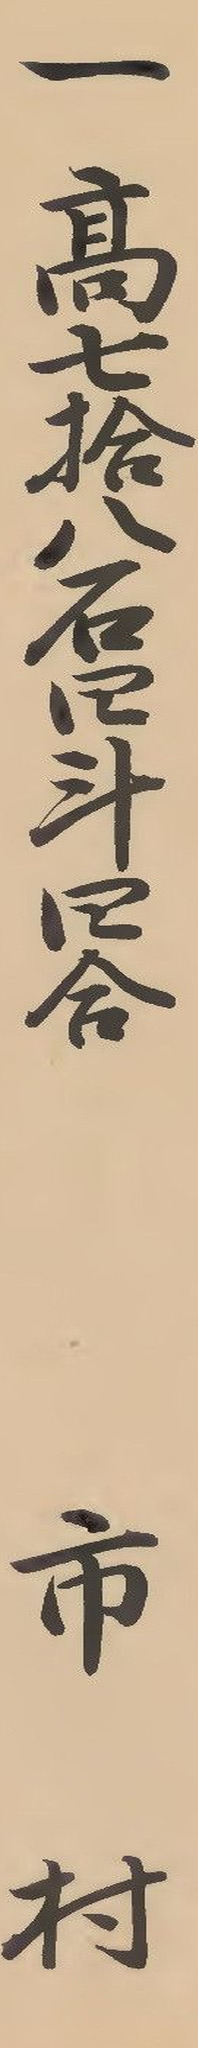一高七拾八石四斗四合市村
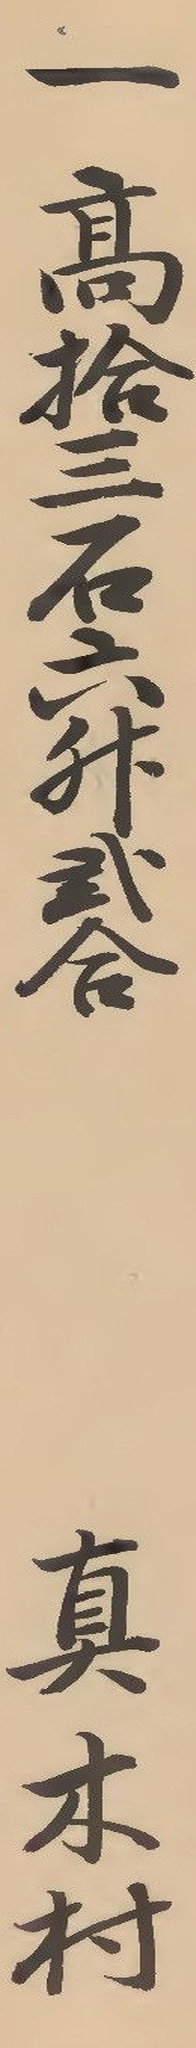一高拾三石六升弐合真木村
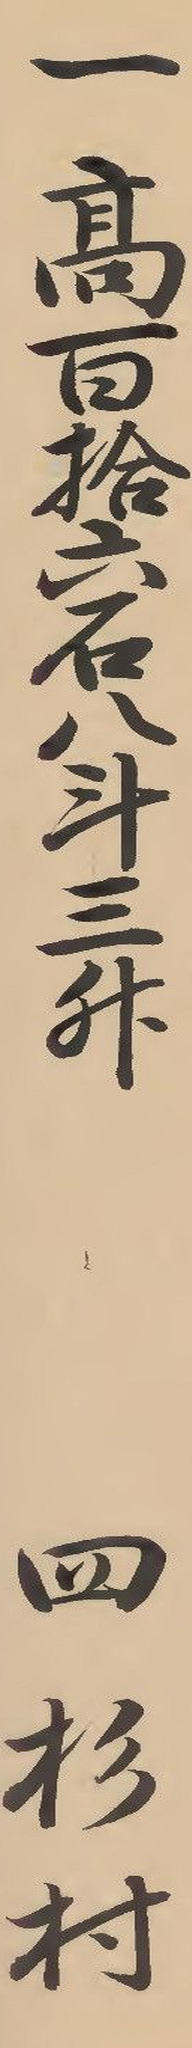一高百拾六石八斗三升四杉村
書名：越前国郷帳
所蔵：国立公文書館 National Archives of Japan
